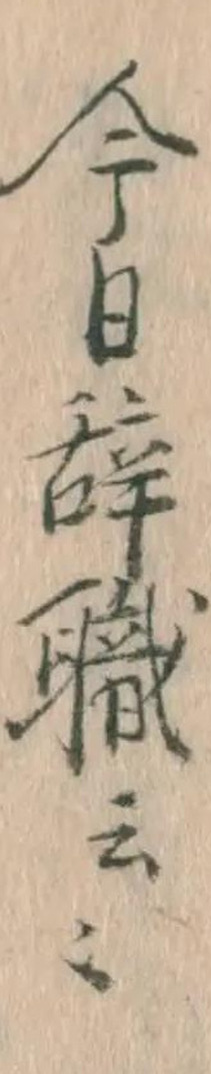今日辞職云々
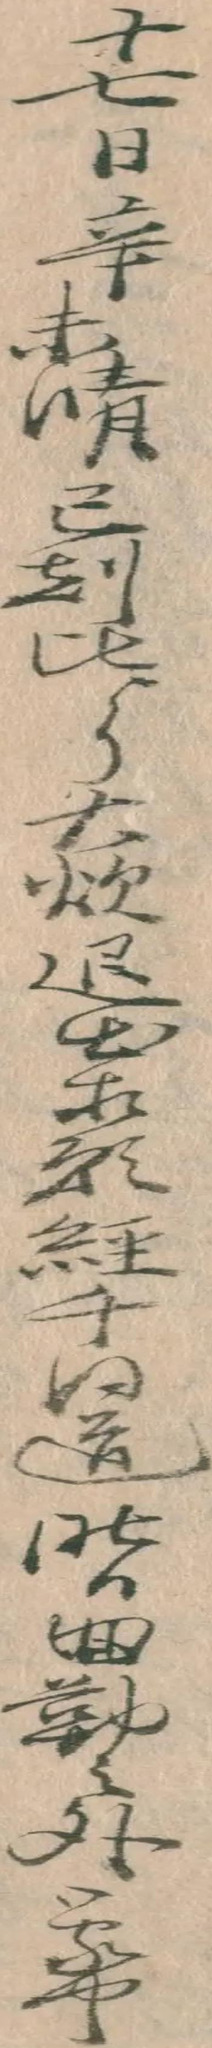十七日辛丑晴巳刻比より大炊退出相願経千同道昨日回勤之外御家中
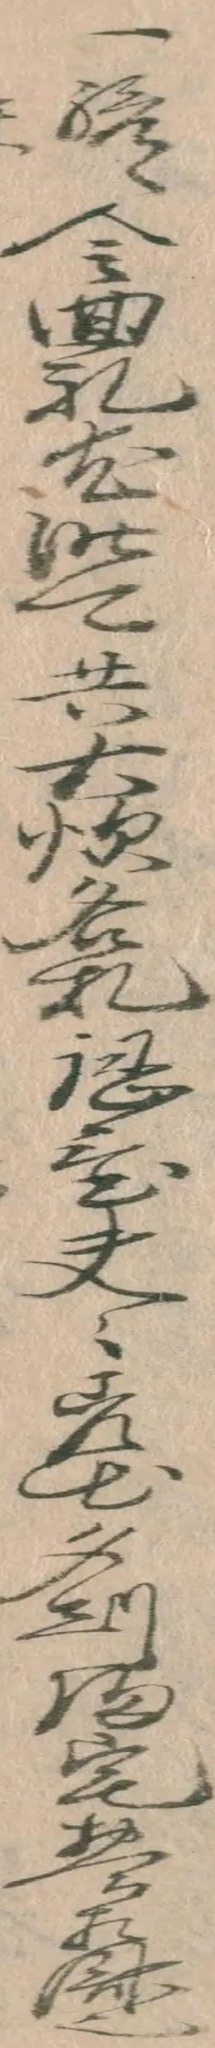一統へ令回礼尤時今共大炊名札認置夫々差出夕刻帰宅惣而相済也
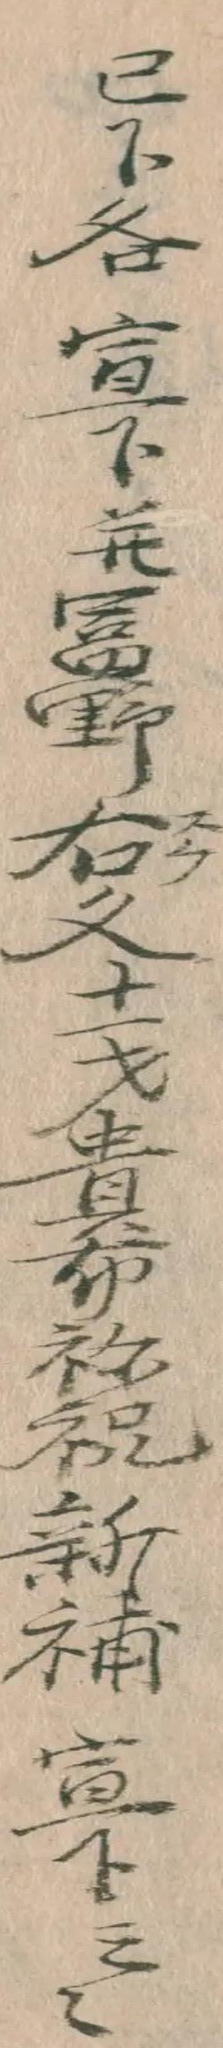已下各宣下并冨野右久十一才貴布称祝新補宣下云々
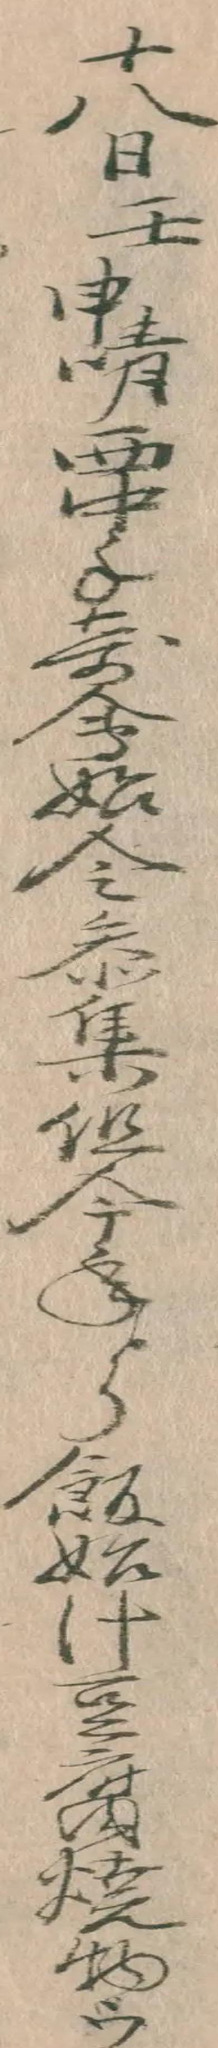十八日壬申晴西中手寄會始令参集但今年より飯始汁豆腐焼物ウ
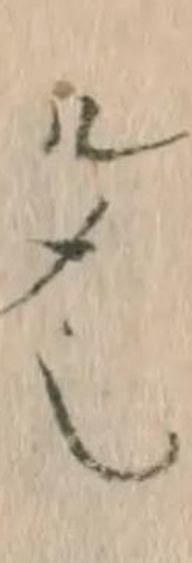ルメ也
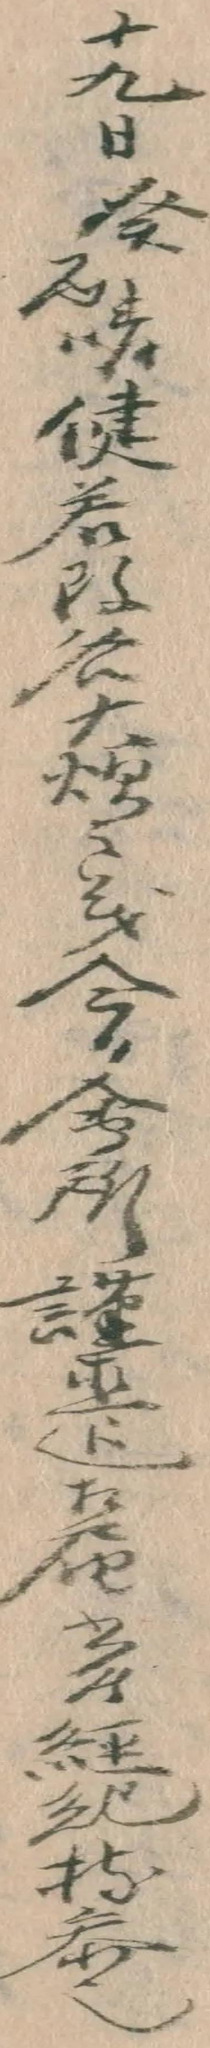十九日癸酉晴健若改名大炊之義今日會所謹直迄相届書付経紀持参也
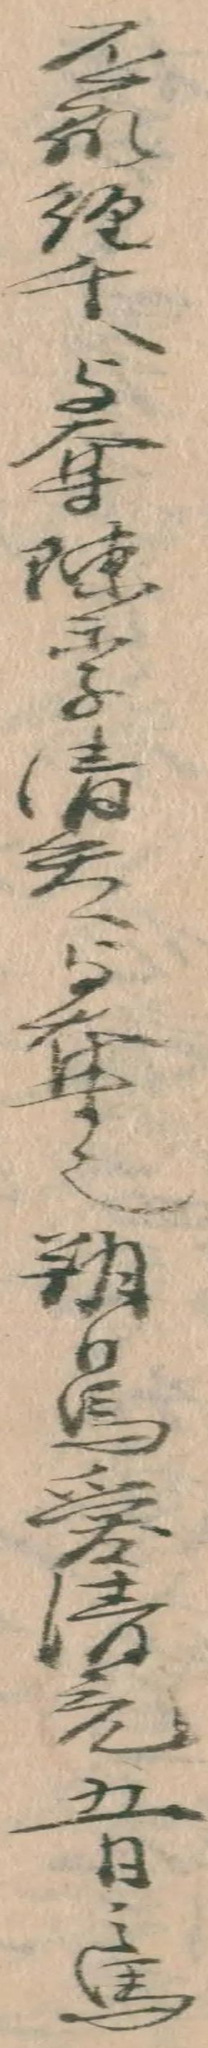丕顕経千へ与奪陳季清矢へ与奪也朔日馬愛清充五日之馬
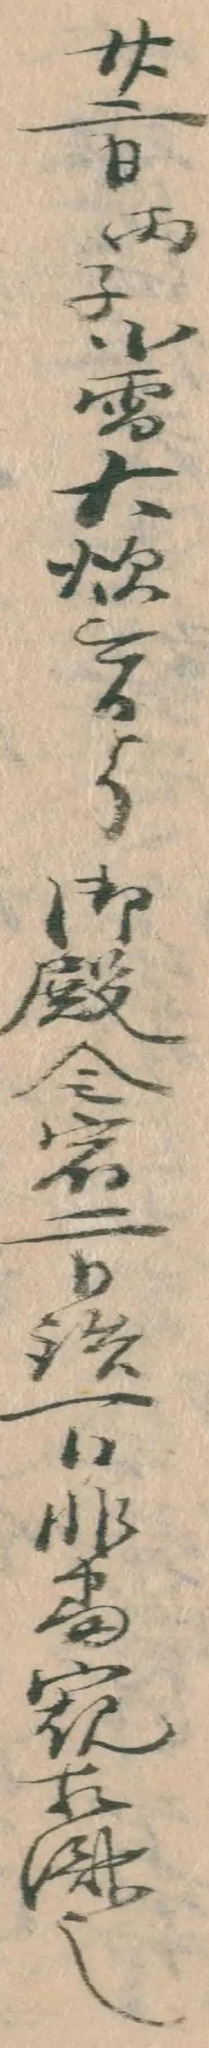廿二日丙子小雪大炊今日より御殿令宿二日詰一日非番宛相済也
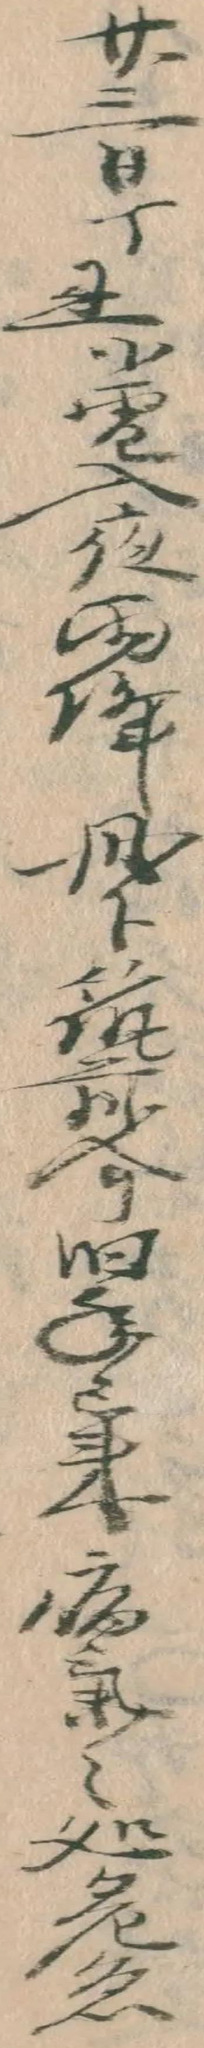廿三日丁丑小雪入夜雨降丹下筑前介旧年已来病氣之処危急
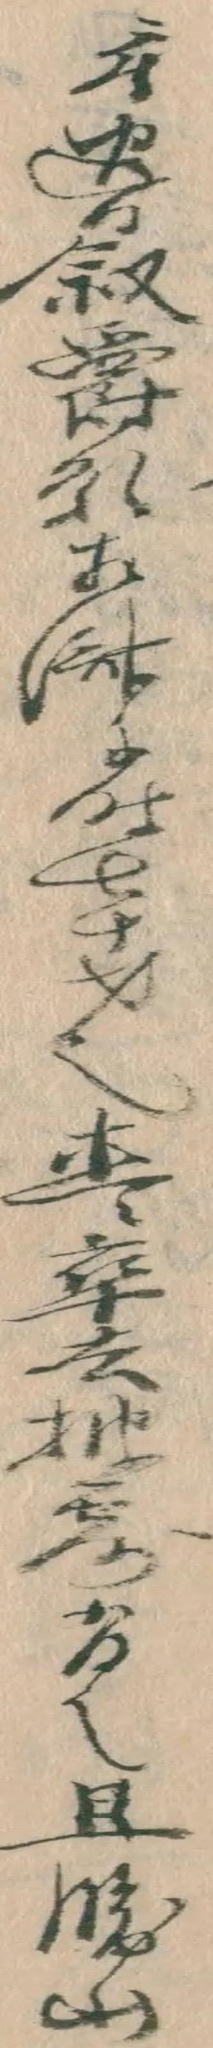ニ付過日叙爵願相済于時七十才也直ニ卒去披露有之且勝山
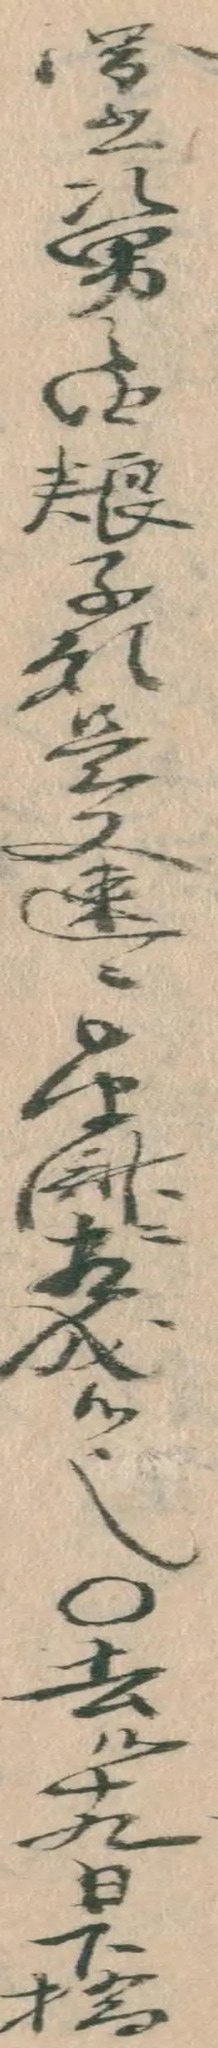図書次男之由養子願是又速に御伝済ニ相成候也○去ル十九日下橋
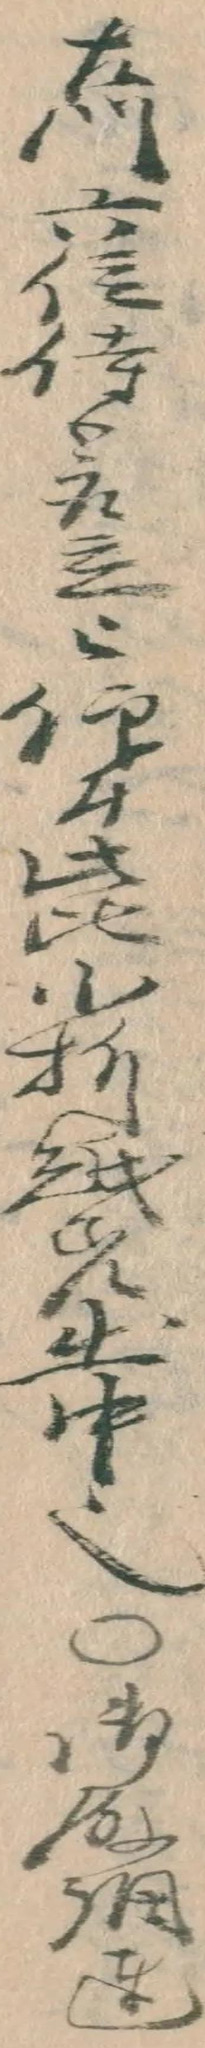左門六位侍御取立被仰付此比小折紙差出申也○御取調達
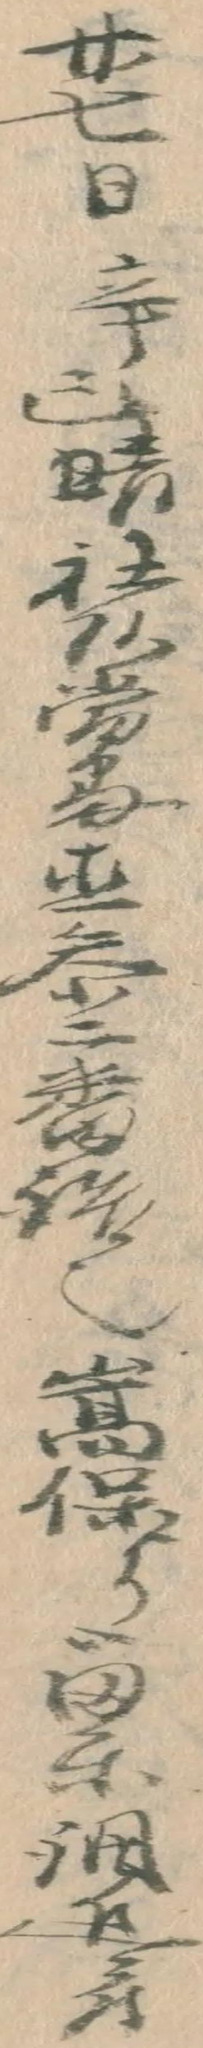廿七日辛巳晴社頭當番直参二番詰也嵩保より御田楽調進ニ付
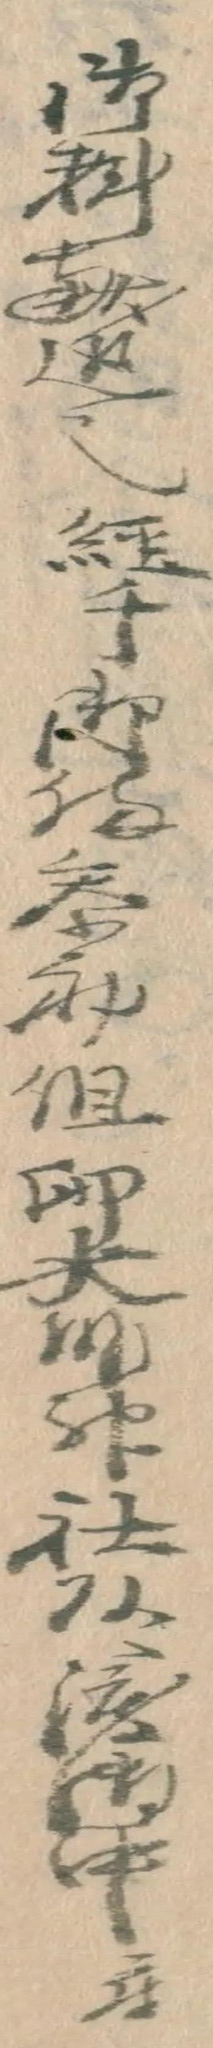御料勘定也経千御備参勤但卯大明神社頭へ渡御中ニ付
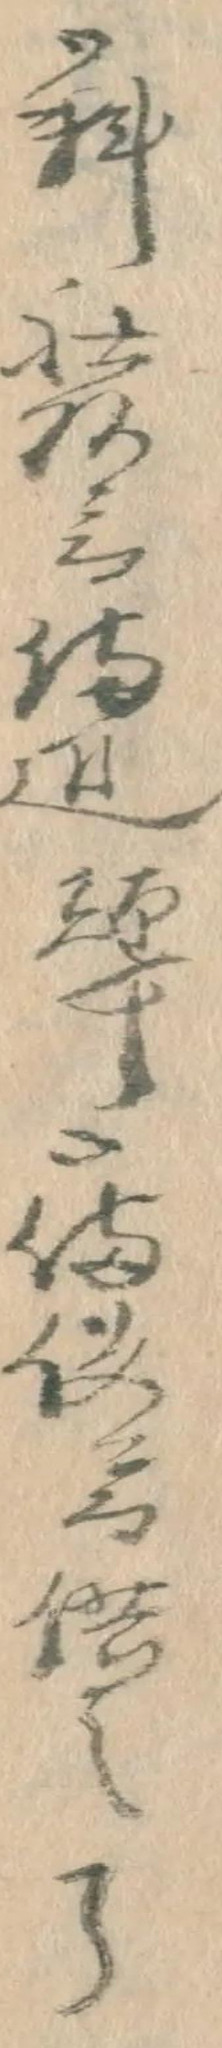御料社頭ニ而備進経千御備役ニ而供之了
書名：賀茂社記録. 第66冊
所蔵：国立国会図書館 National Diet Library, JAPAN
